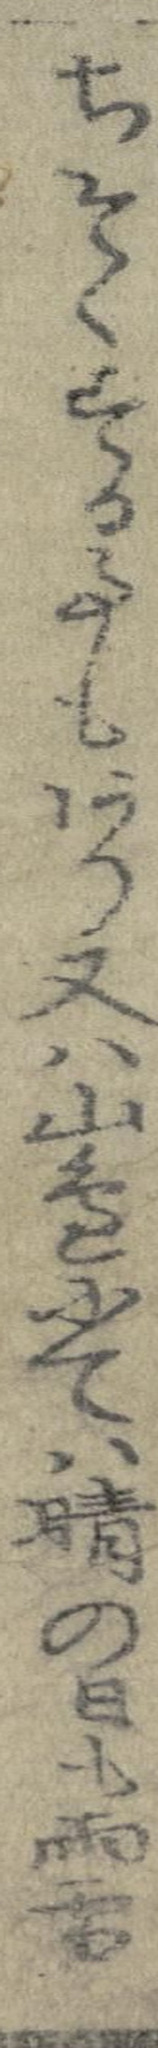ちそくする事もあり又は山辺にては晴の日も雨雪
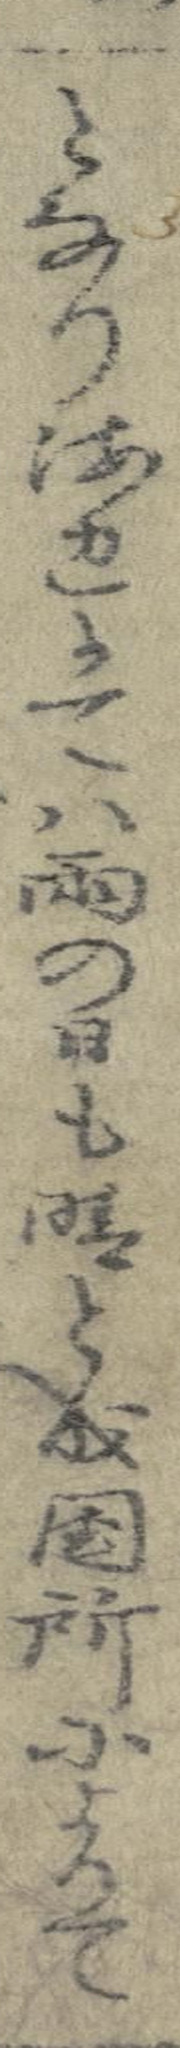となり海辺にては雨の日も晴と成国所によりて
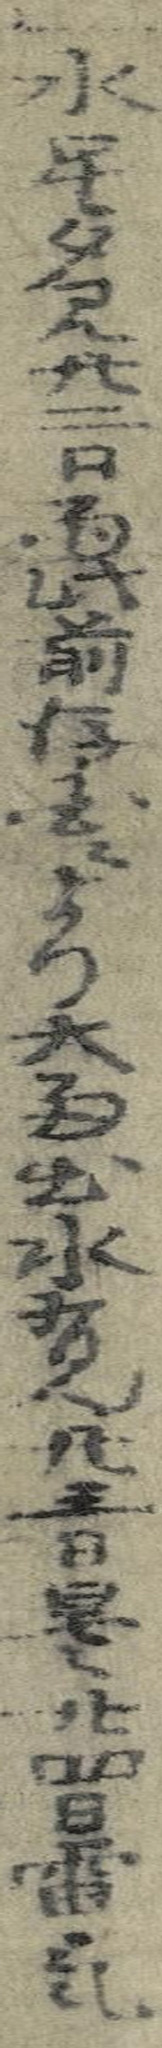水星夕見廿二日あめ此前後国により大雨出水有也廿三日曇廿四日雷気
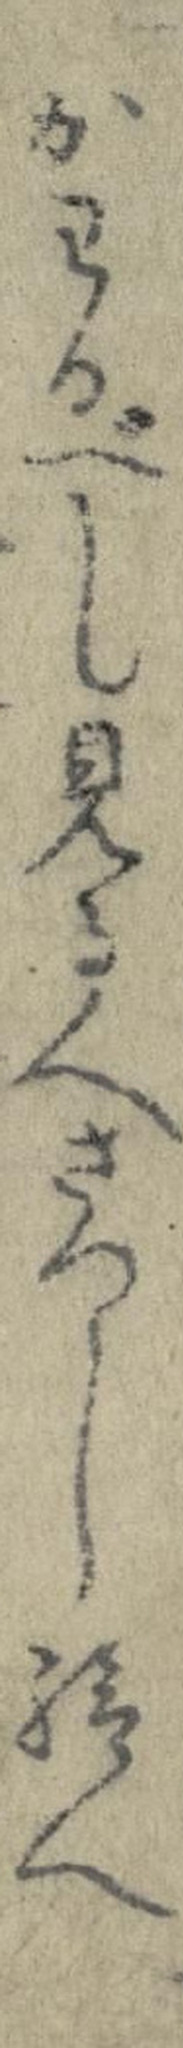かわるべし見る人さつし給へ
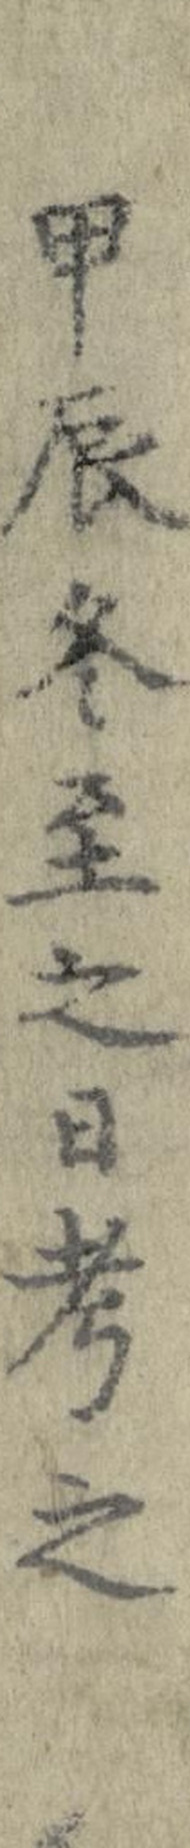甲辰冬至之日考之
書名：天保十六年乙巳七曜　晴雨考　土御門殿御免
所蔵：東京大学地震研究所図書室 Earthquake Research Institute Library, The University of Tokyo, JAPAN
